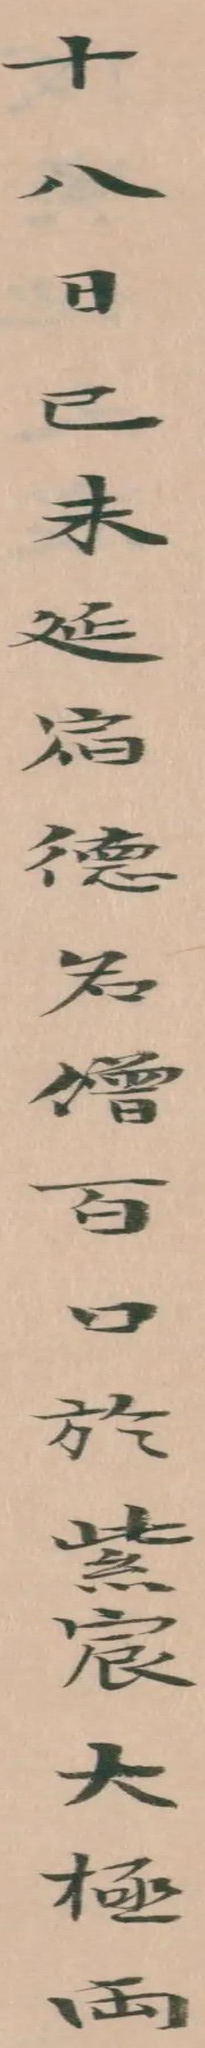十八日己未延宿徳名僧百口於紫宸大極両
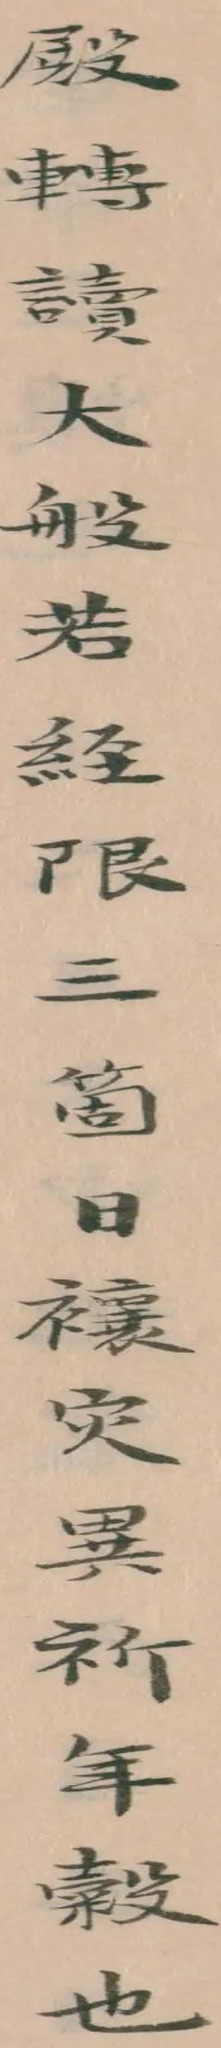殿転読大般若経限三箇日禳灾異祈年穀也
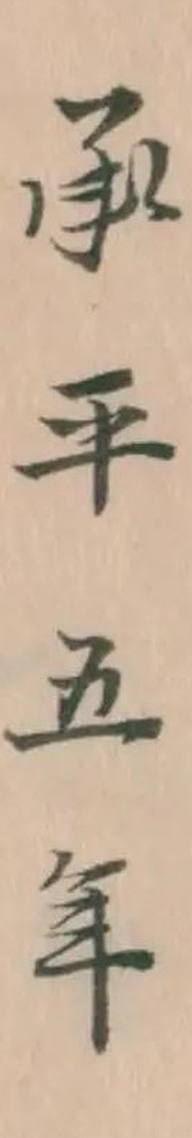承平五年
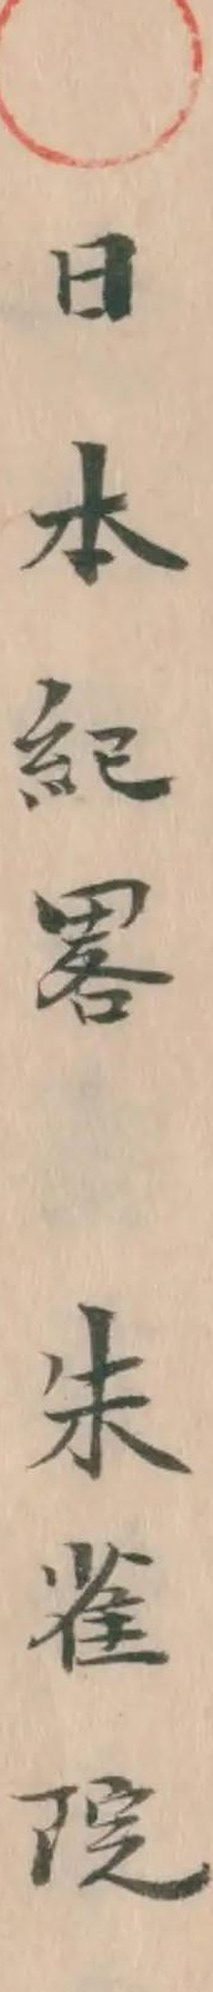○日本紀略朱雀院
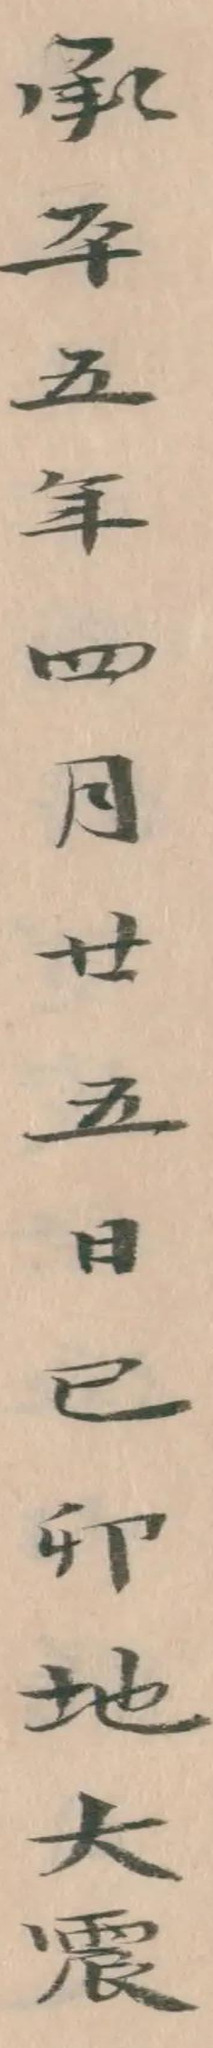承平五年四月廿五日己卯地大震
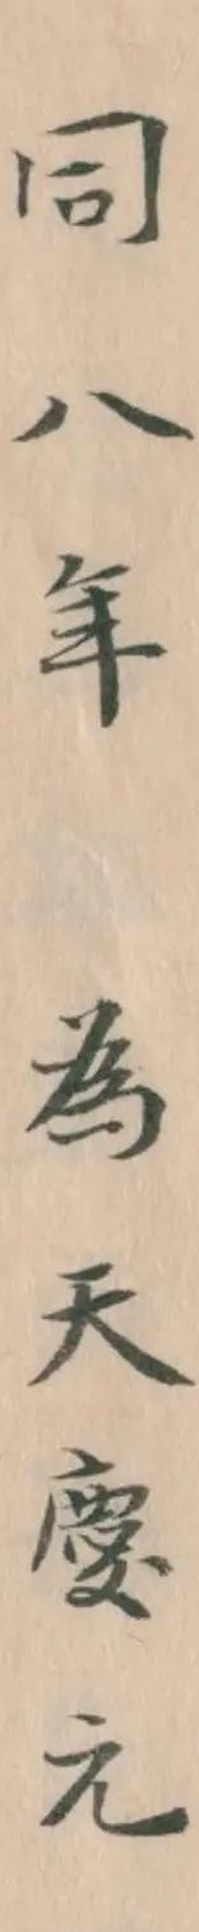同八年為天慶元
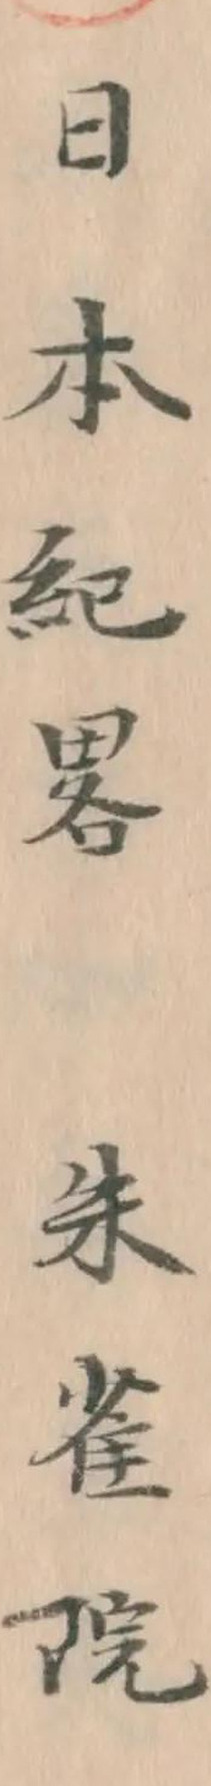○日本紀略朱雀院

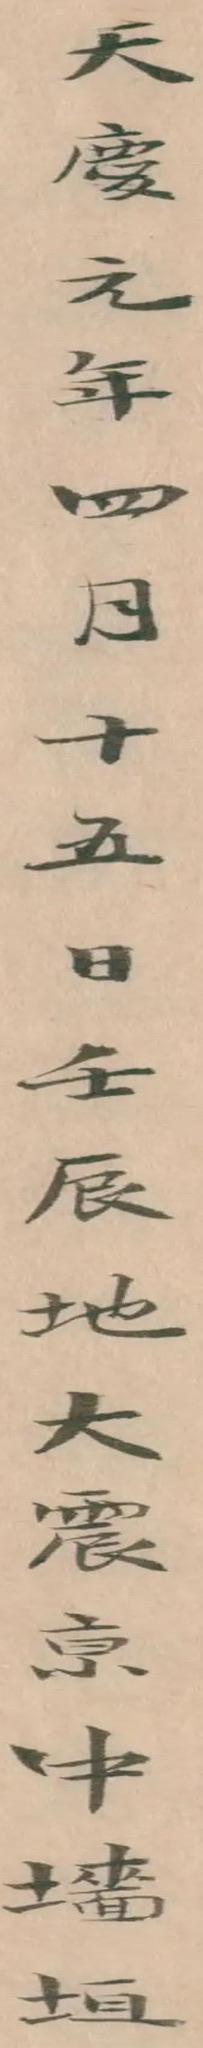天慶元年四月十五日壬辰地大震京中墻垣
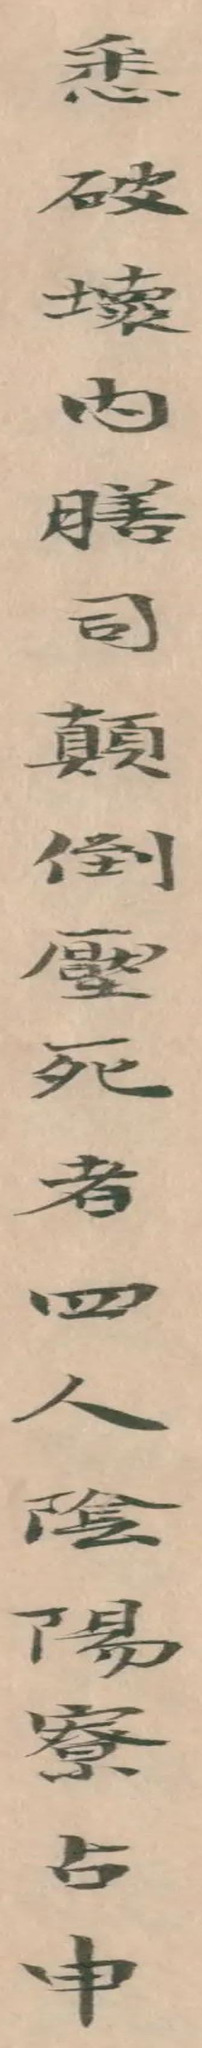悉破壊内膳司顛倒圧死者四人陰陽寮占申
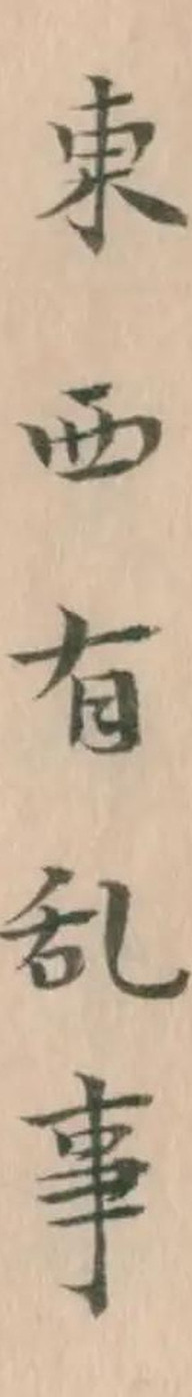東西有乱事
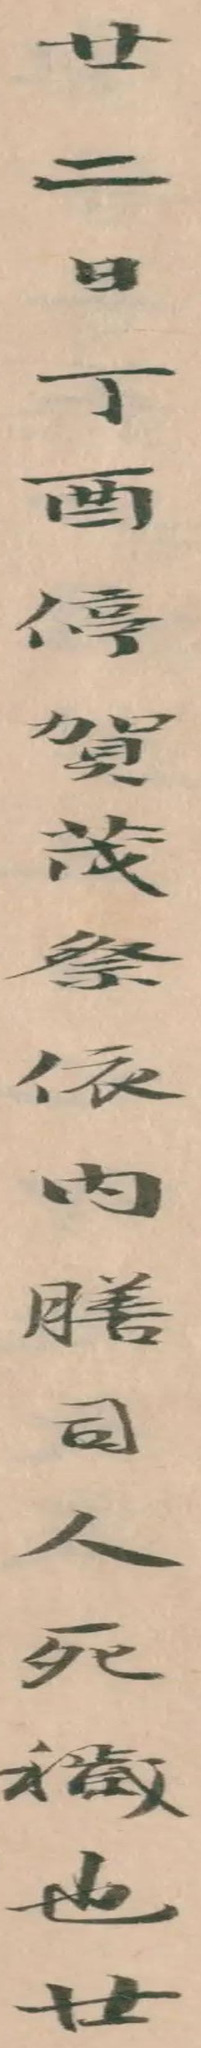廿二日丁酉停賀茂祭依内膳司人死穢也廿
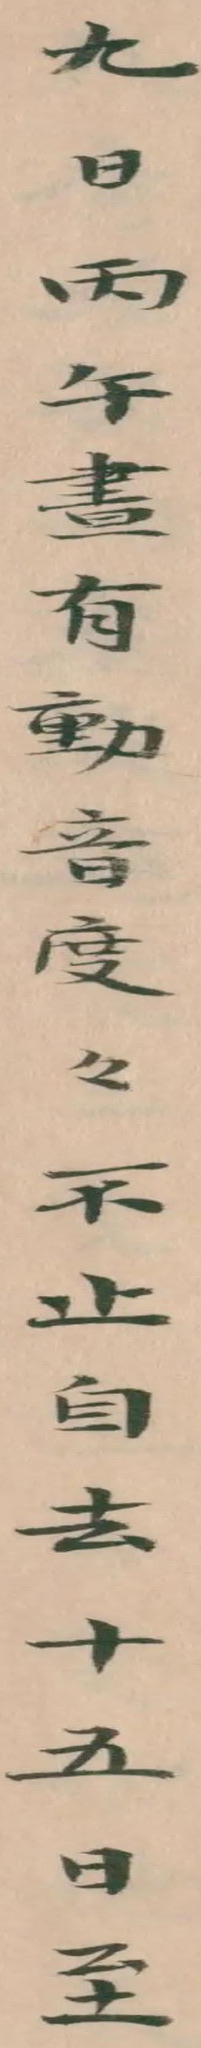九日丙午昼有動音度々不止自去十五日至
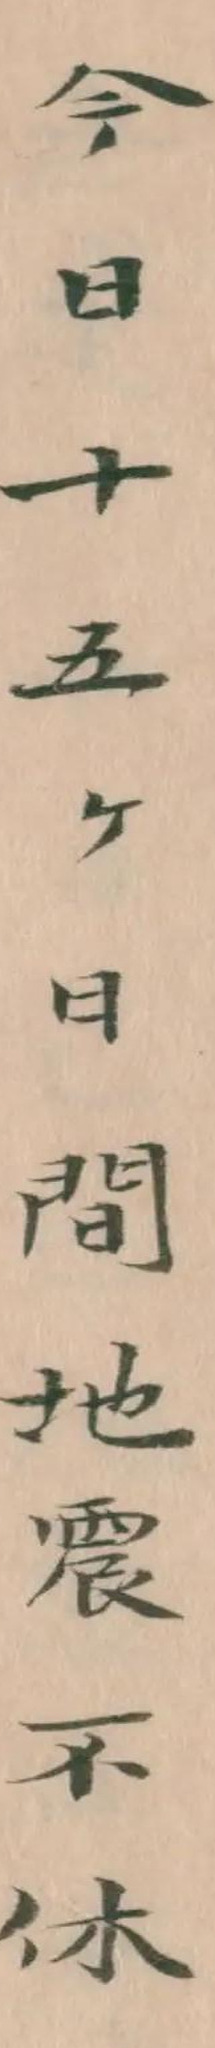今日十五ヶ日間地震不休
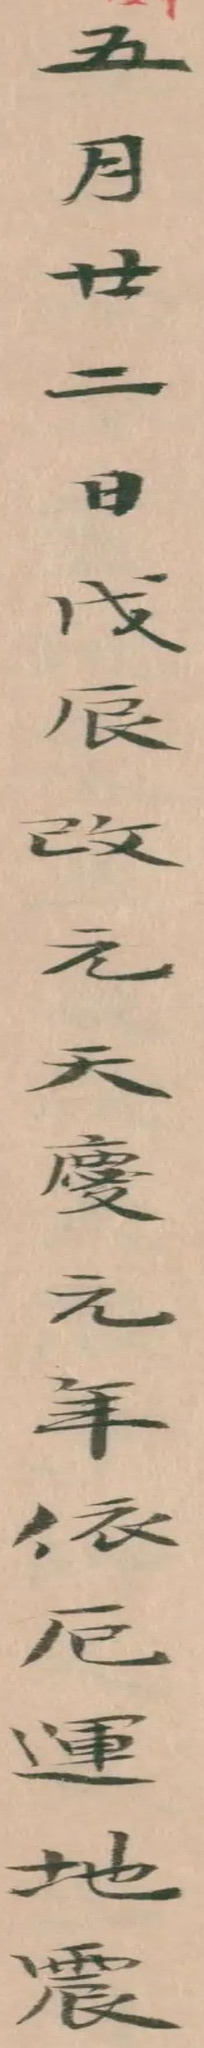五月廿二日戊辰改元天慶元年依厄運地震
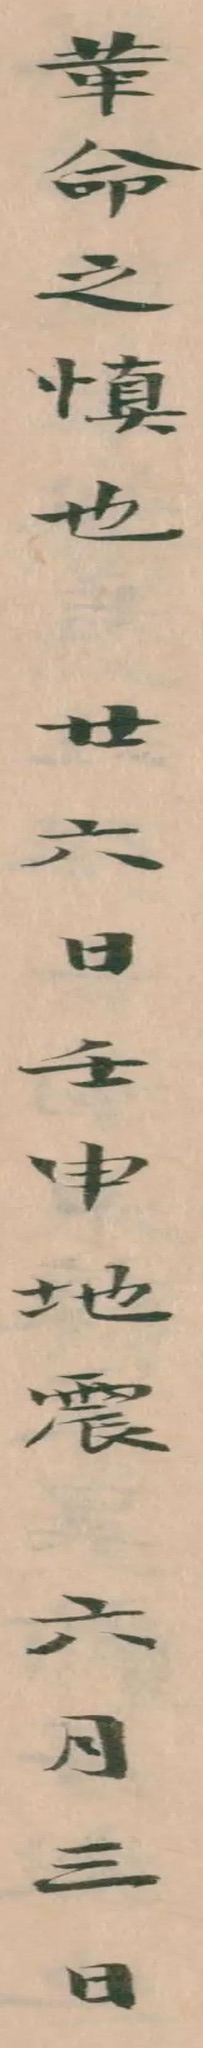革命之慎也廿六日壬申地震六月三日
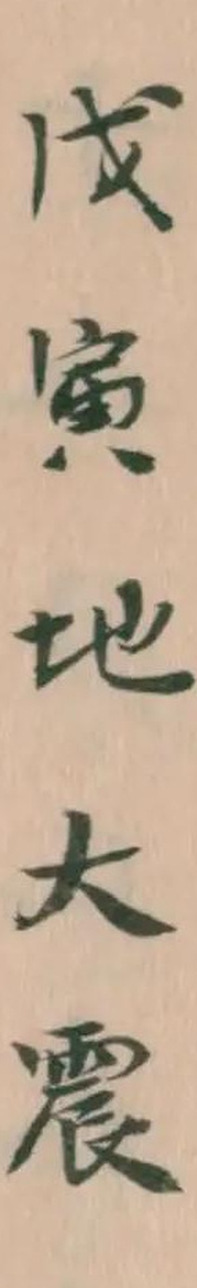戊寅地大震
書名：地災撮要. 巻5-6(地震之部)
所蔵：国立国会図書館 National Diet Library, JAPAN
